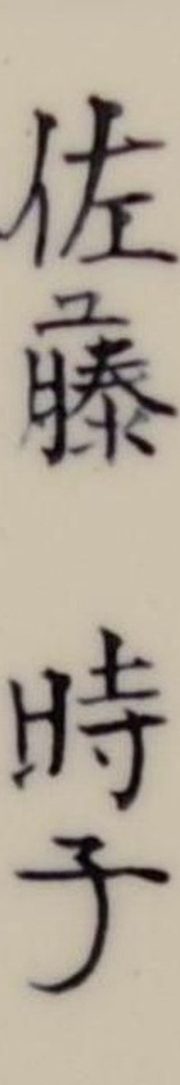佐藤時子
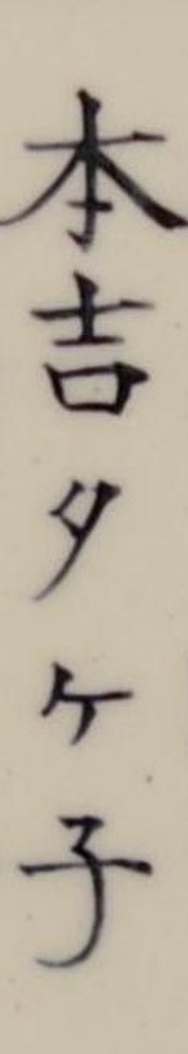本吉タケ子
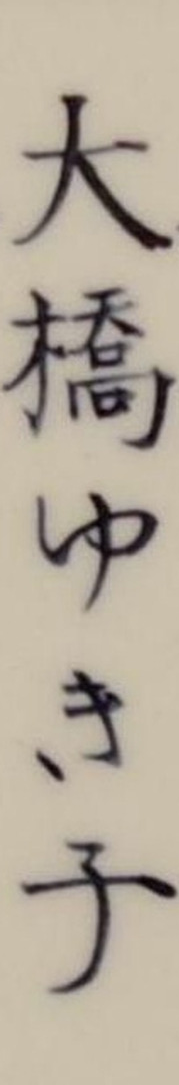大橋ゆき子
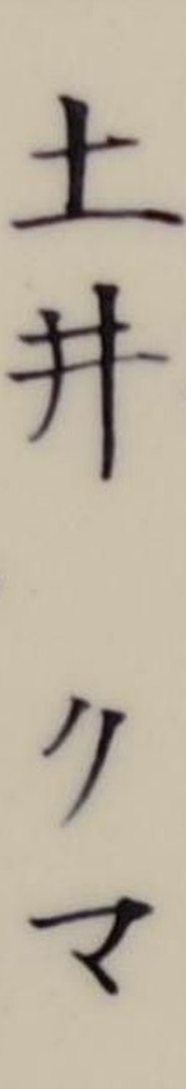土井クマ
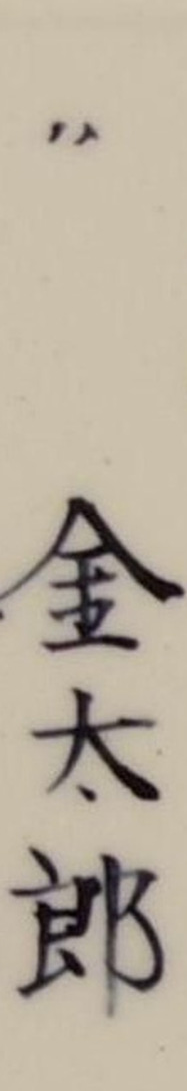金太郎
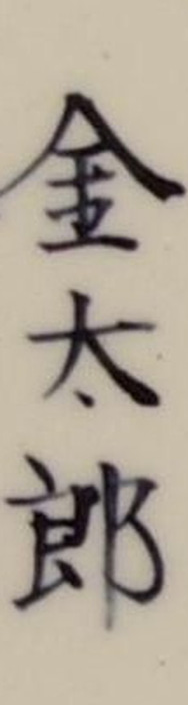金太郎
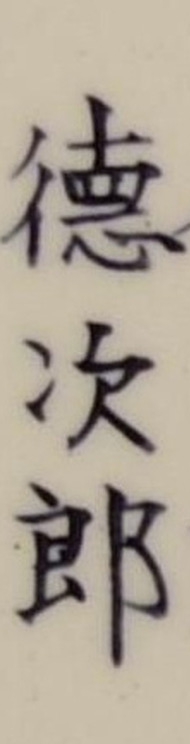徳次郎
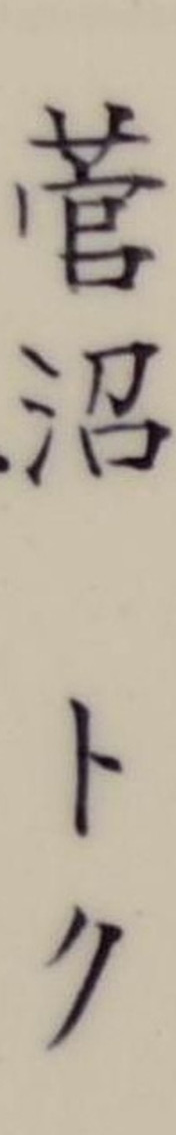菅沼トク
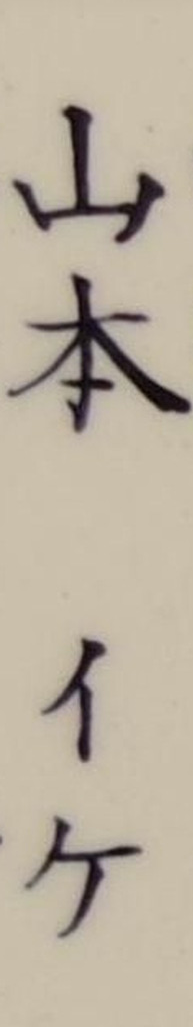山本イケ
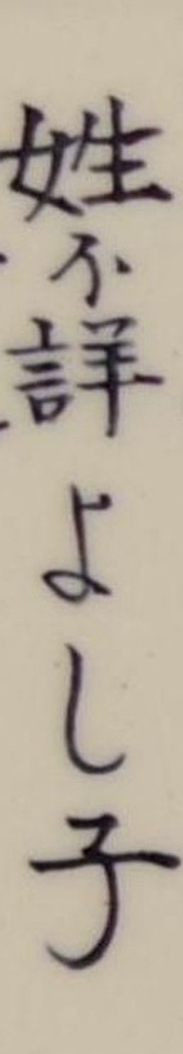姓不詳よし子
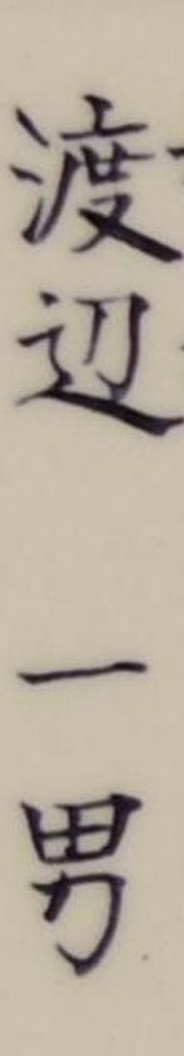渡辺一男
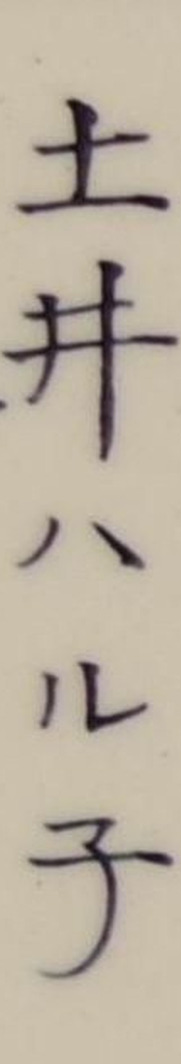土井ハル子
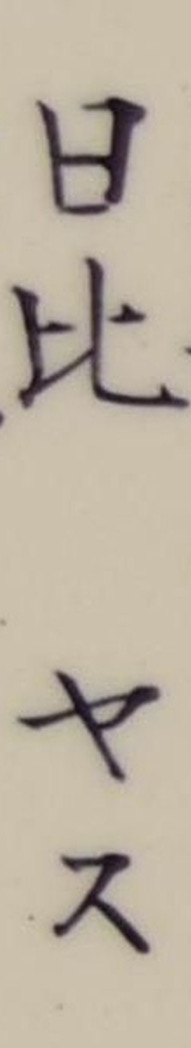日比ヤス
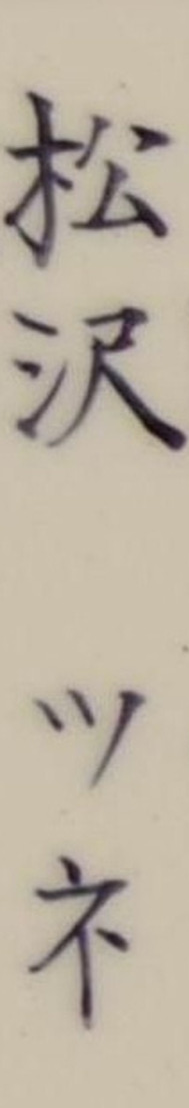松沢ツネ
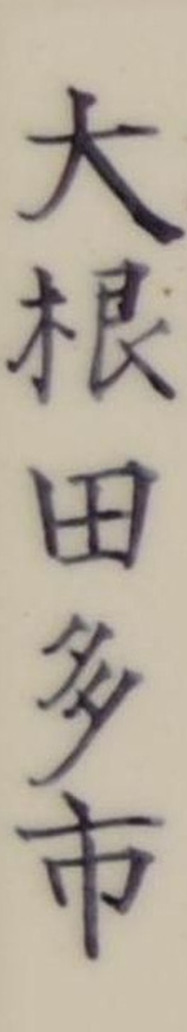大根田多市

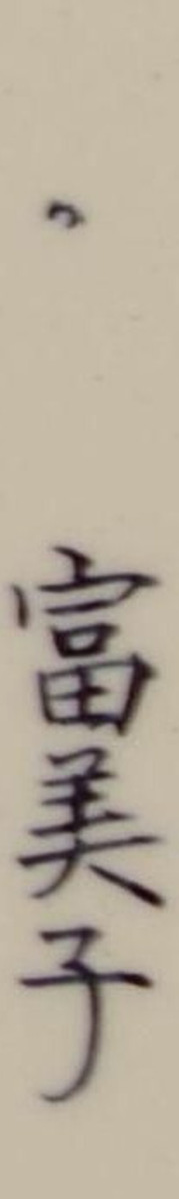富美子
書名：M~S
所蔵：高野山金剛峯寺
